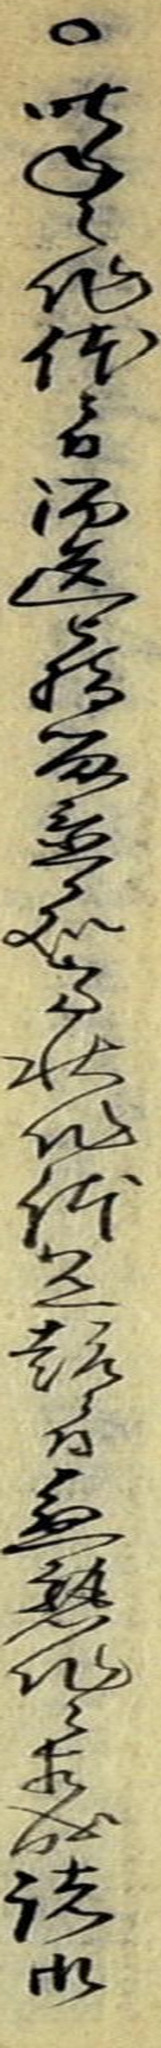○昨年之作体ニ付酒造被指留置候処当秋作体宜趣ニ付愈熟作ニ相成諸御
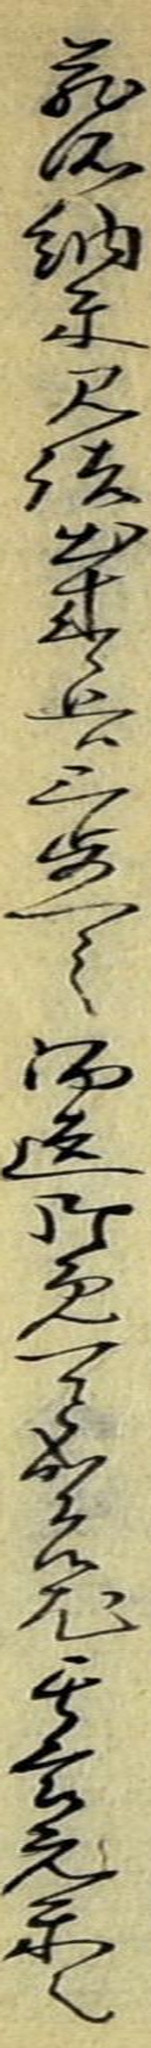蔵所納米見詰出来候上ハ三歩一之酒造御免可被成ニ候尤其節元米之
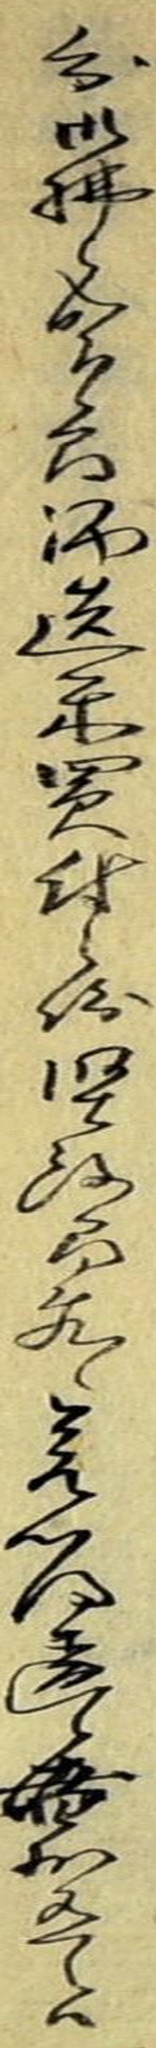分御払被成下候間酒造米買付之儀堅致間敷候若心得違之者於有之ハ
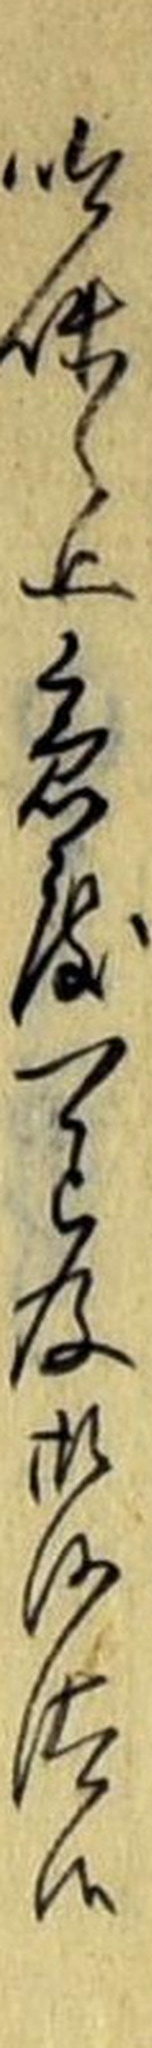吟味之上急度可被及御沙汰候

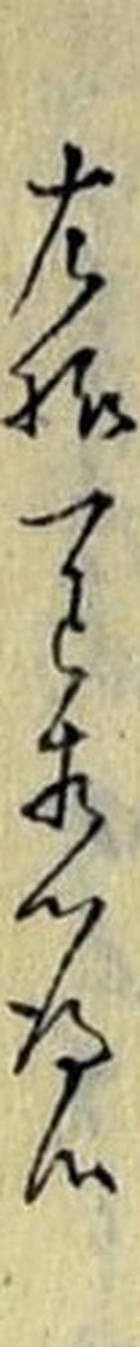左様相被心得候
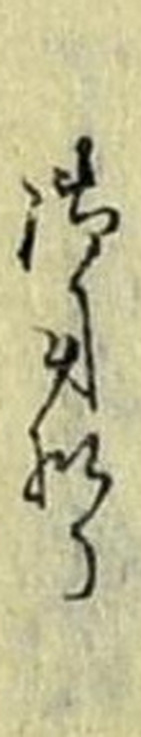御用掛り
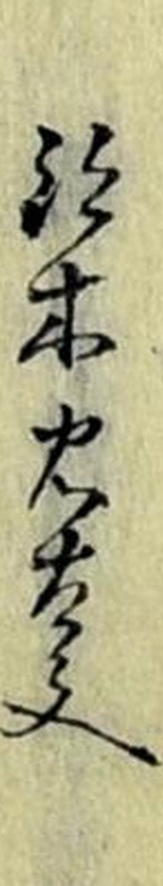鈴木忠太夫
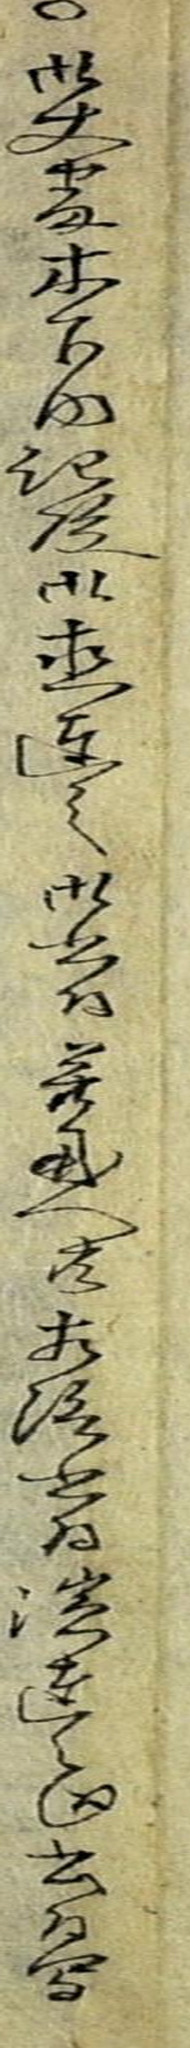○御使番木下内記殿御直達之御書付并用人共相渡書付演達之趣書付写
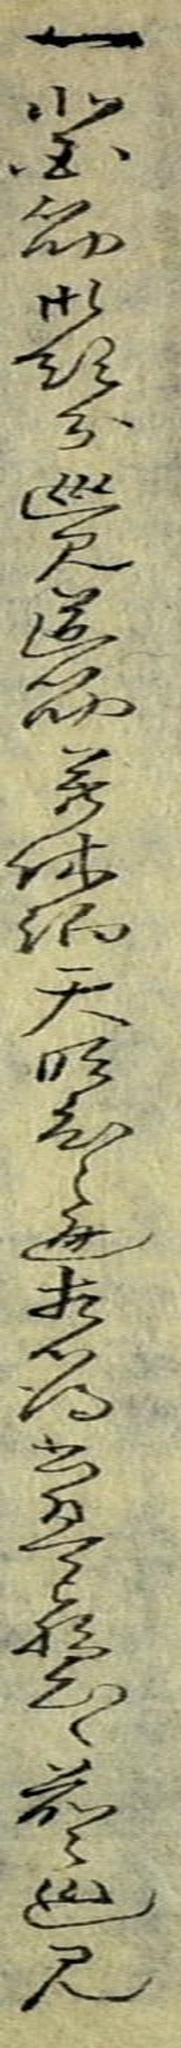一北国筋御領分巡見道筋并休泊天明度之通相心得書付可被指出候前々巡見
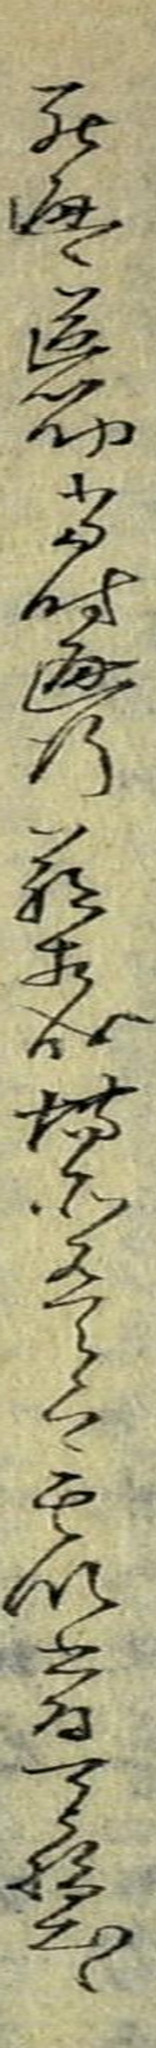罷通候道筋当時通行難相成場所有之候ハヽ其段書付可被指出候
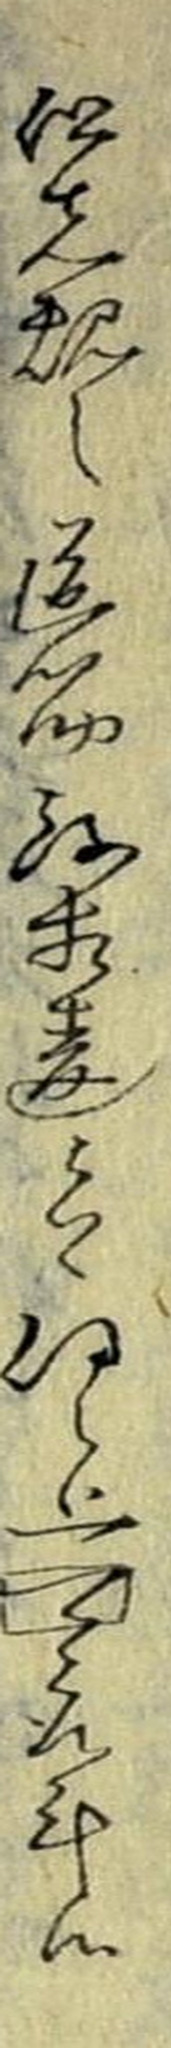但先規之道筋致相違候ハヽ之伺上可取計候
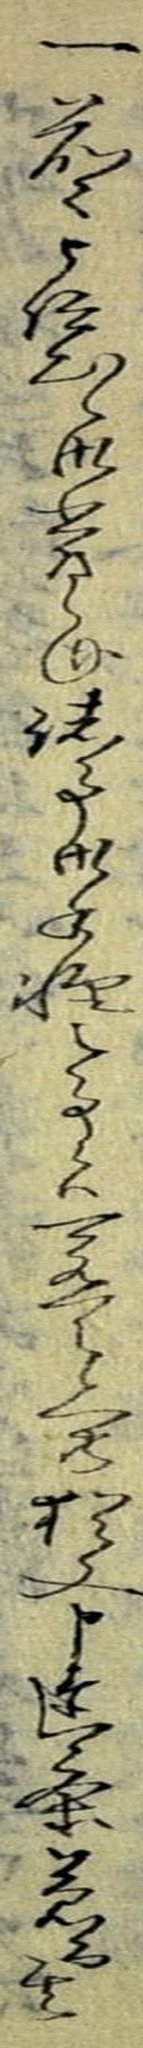一前々被仰出候御書付之趣諸事御手軽之事ニ候可有之候へ共猶又申達候条兼而其
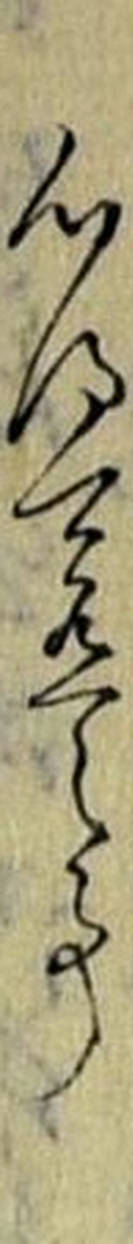心得可有之事
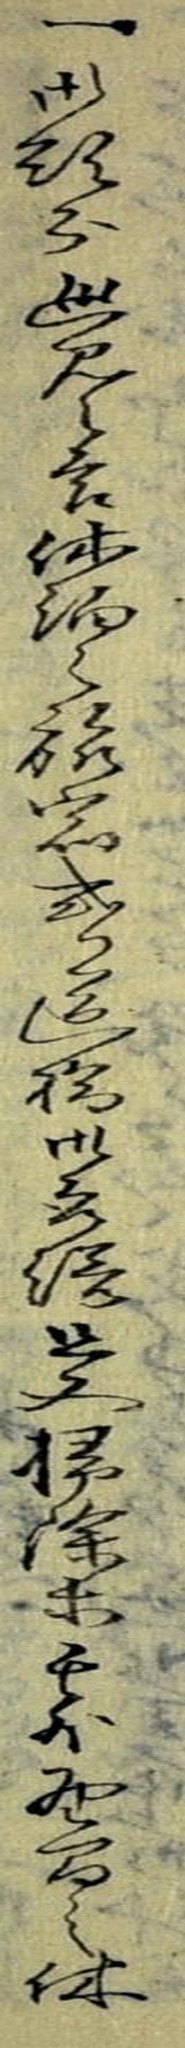一御領分巡見之節休泊之旅宿或ハ道橋御取繕且又掃除等其外野間之休
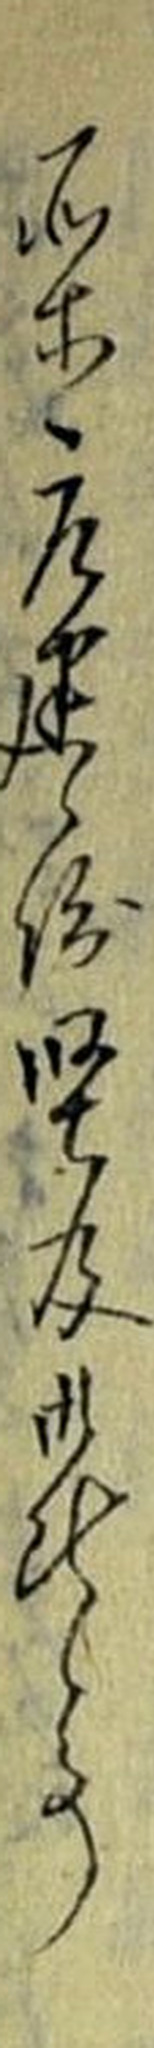所等取建候儀堅及御断候事
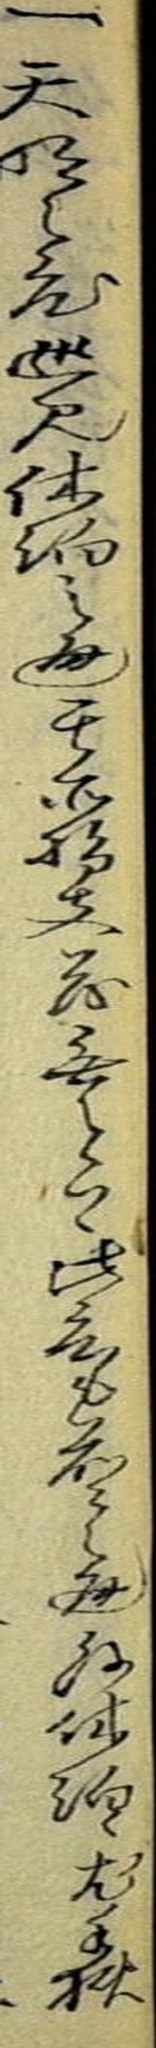一天明之度巡見休泊之通其所指支荷無之候ハヽ此度も前々之通致休泊候尤手狭
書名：命令之部 五
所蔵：福井県文書館 Fukui Prefectural Archives
